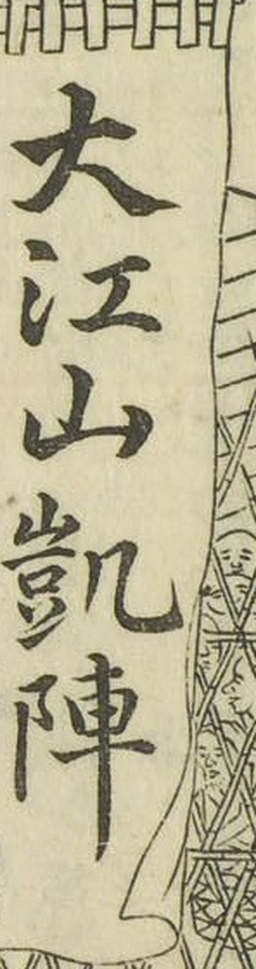大江山凱陣
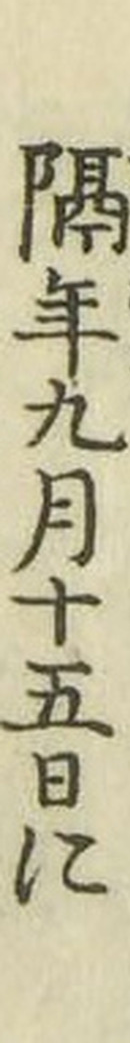隔年九月十五日に
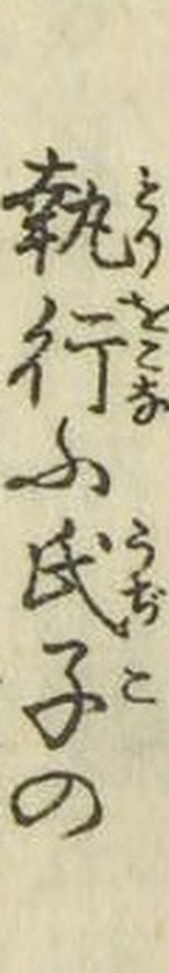執行ふ氏子の
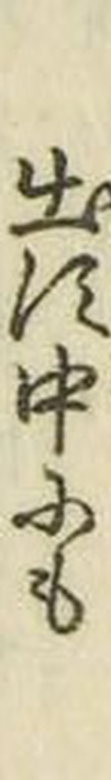出す中にも
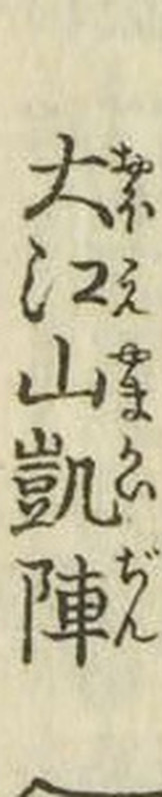大江山凱陣
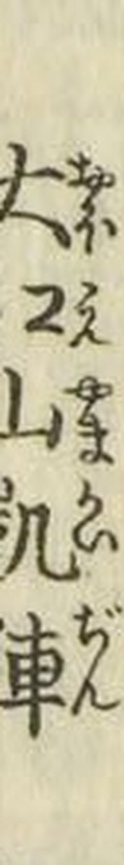大江山凱陣
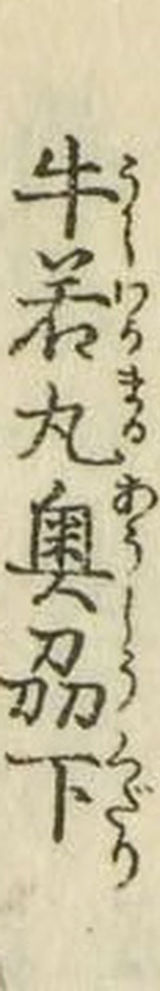牛若丸奥州下
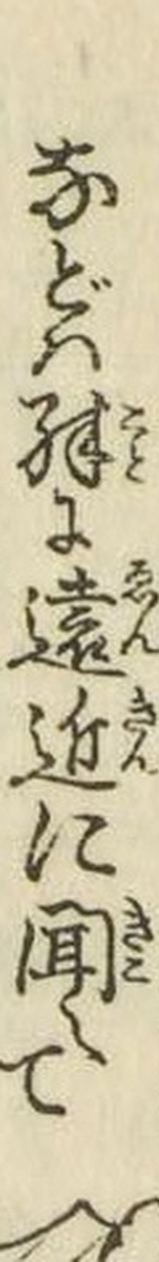などは殊に遠近に聞えて

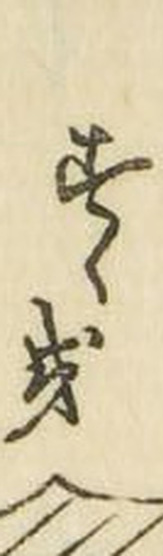すゝき

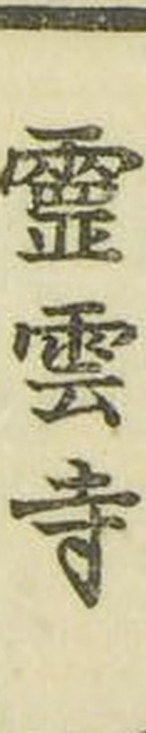霊雲寺
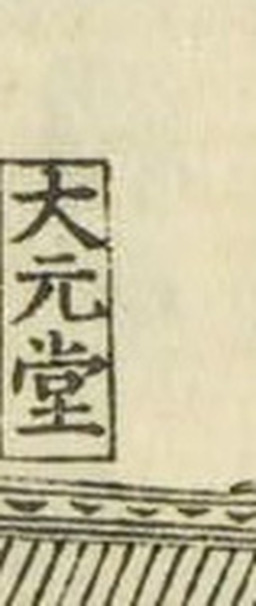大元堂
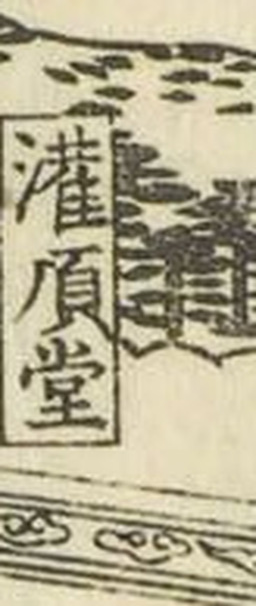潅頂堂
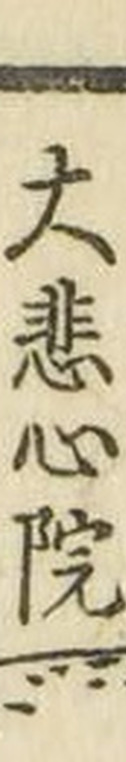大悲心院
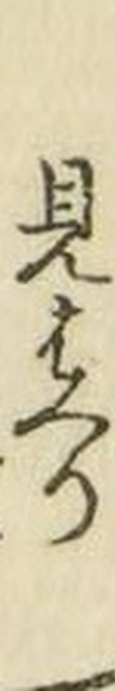見はへり
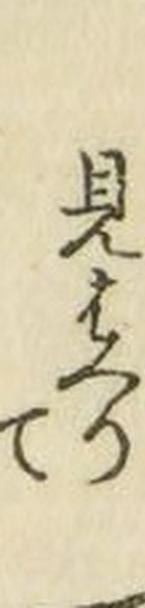見はへり
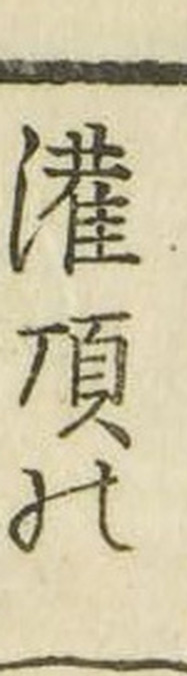潅頂の
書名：江戸名所図会 20巻 巻之14
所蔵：東京学芸大学教育コンテンツアーカイブ
